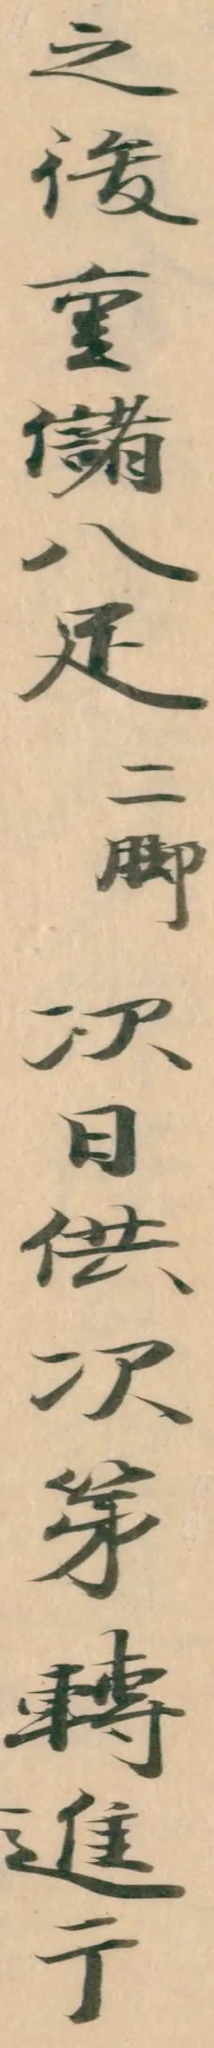之後重儲八足二脚次日供次第転進干
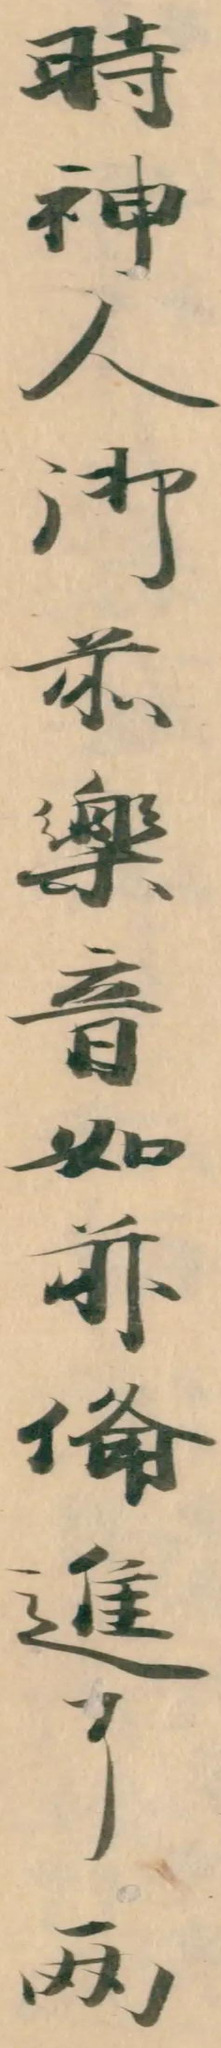時神人御前楽音如前備進に両
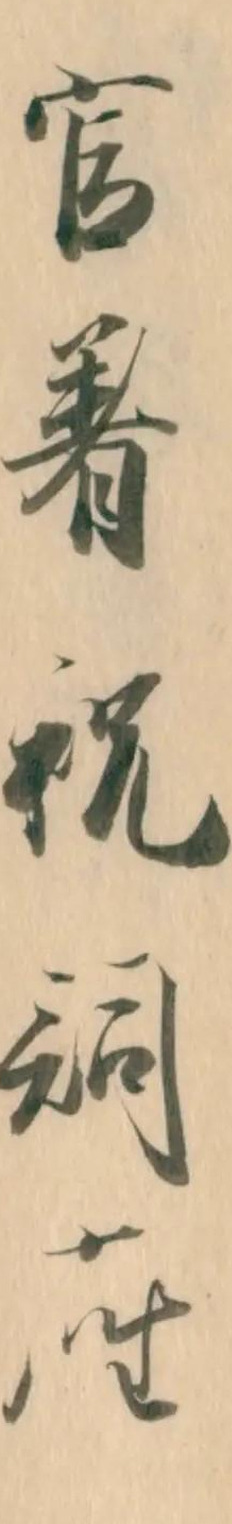官着祝詞座
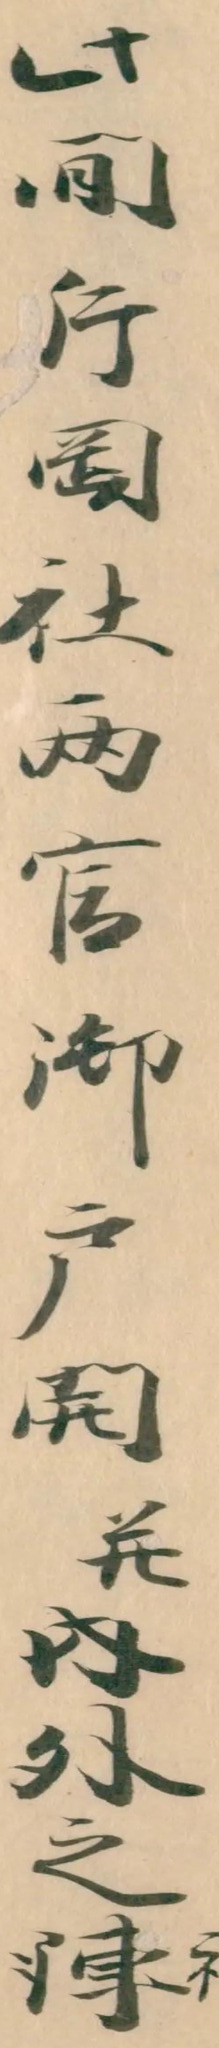此間片岡社両官御戸開并内外之陣
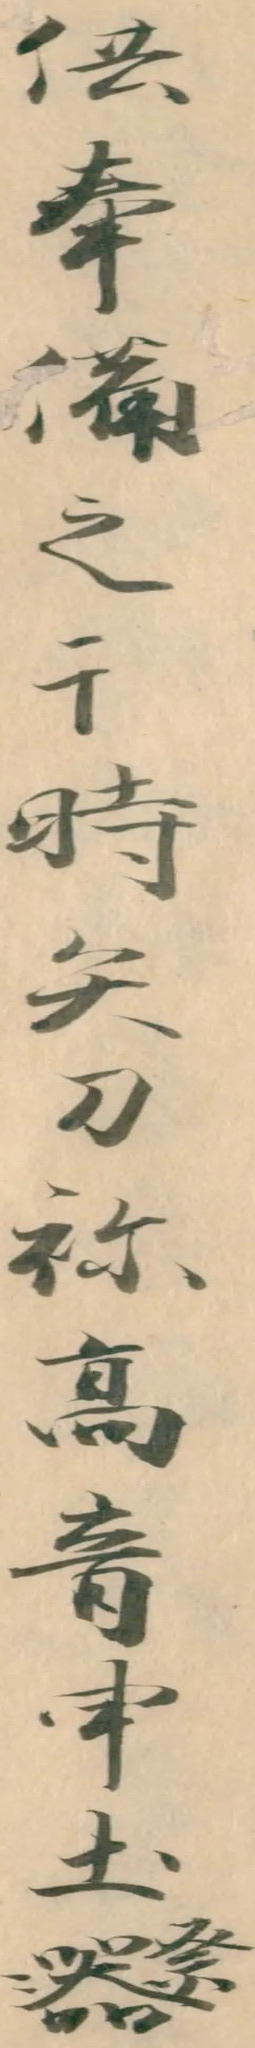供奉備之于時矢刀禰高音申土器
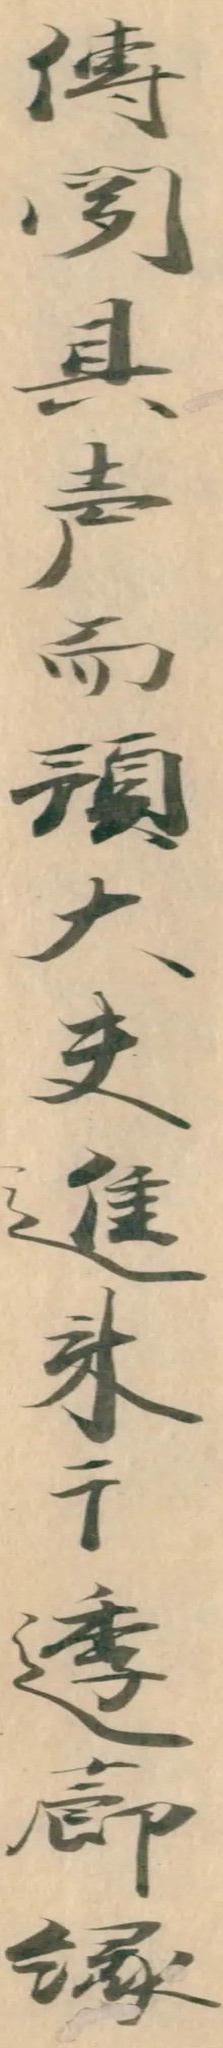伝聞其声而預大夫進来于透廊縁
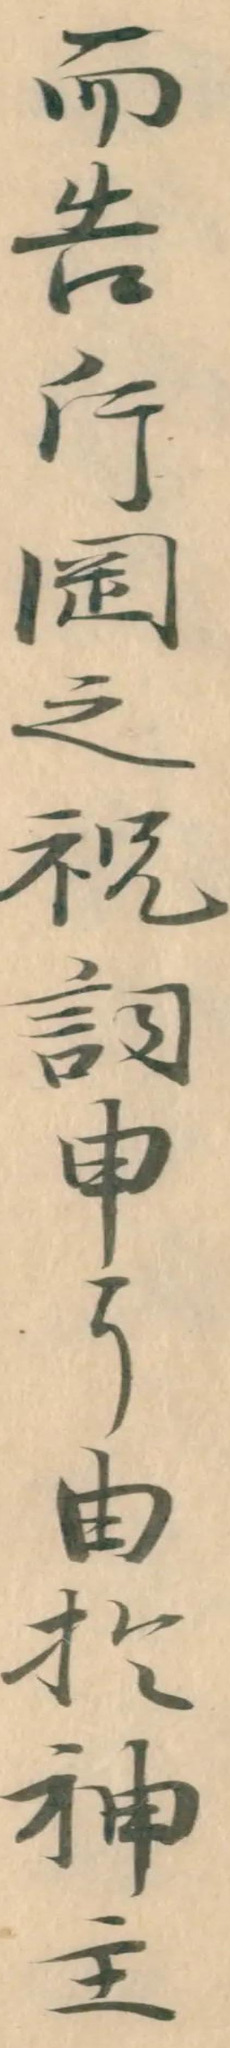而告片岡之祝詞申に由於神主
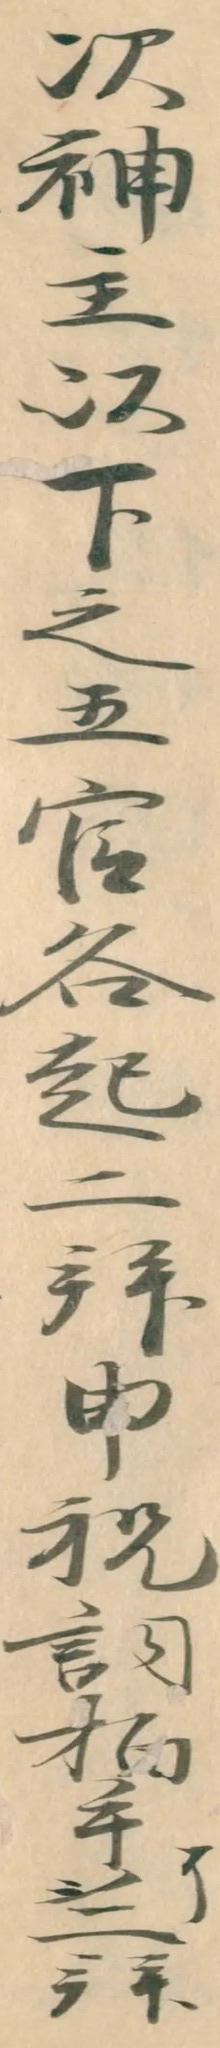次神主以下之五官各起二拝申祝詞柏手ノ二拝
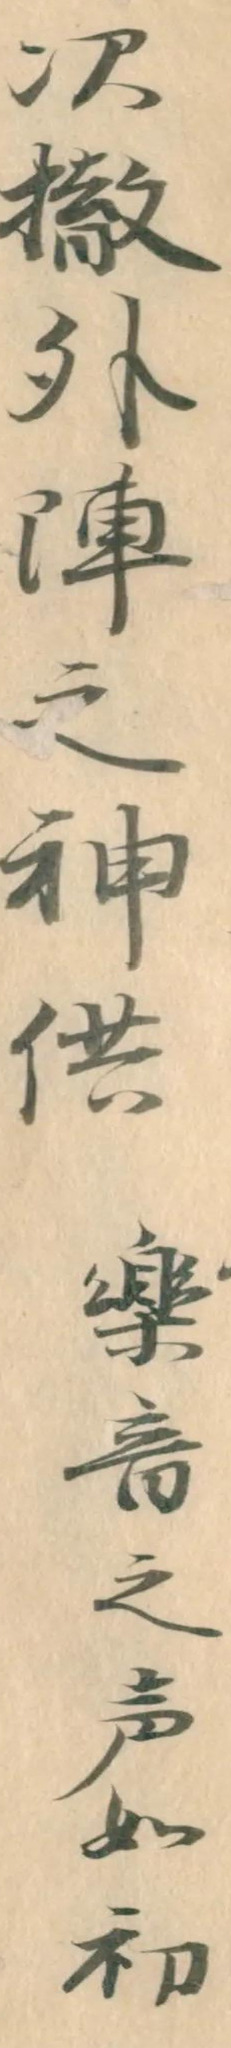次撤外陣之神供楽音之声如初
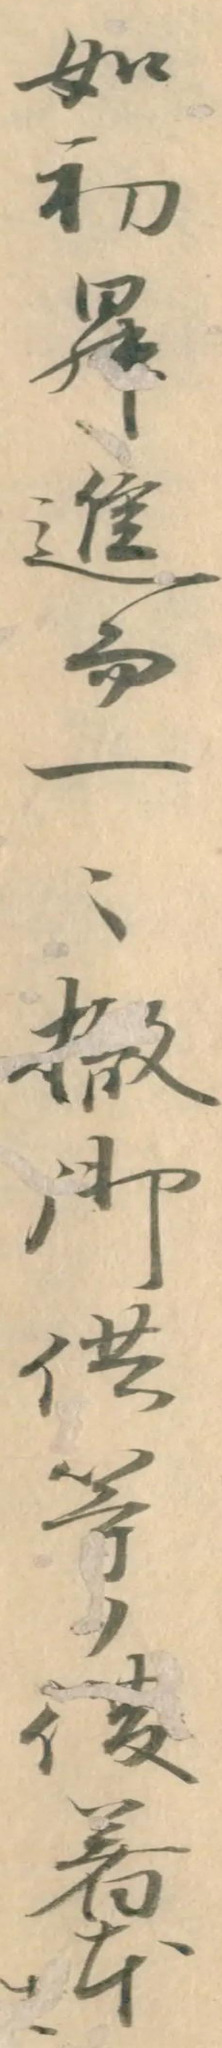如初昇進而一々撤御供等の復着本

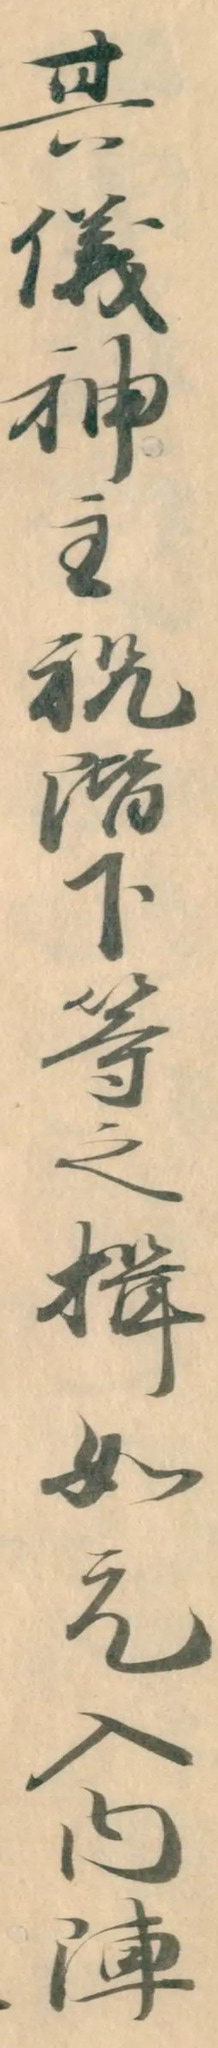其儀神主祝階下等之揖如元入内陣
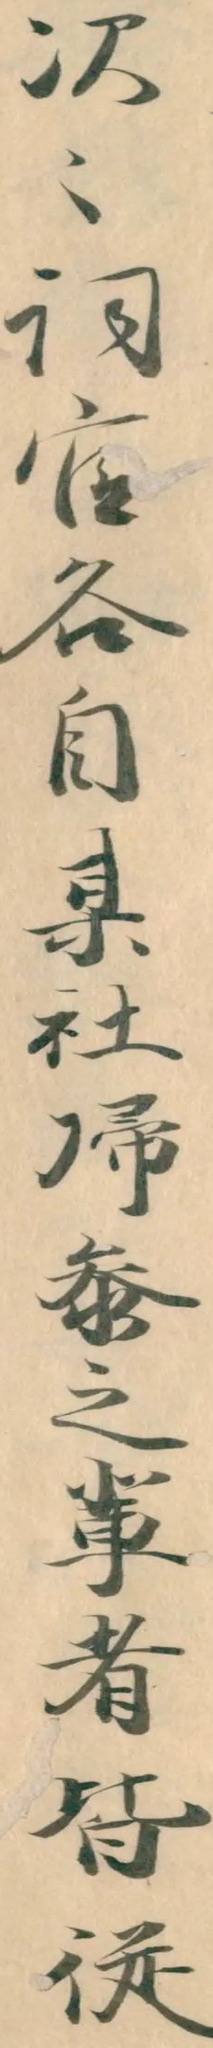次々詞官各自某社帰参之輩は皆従
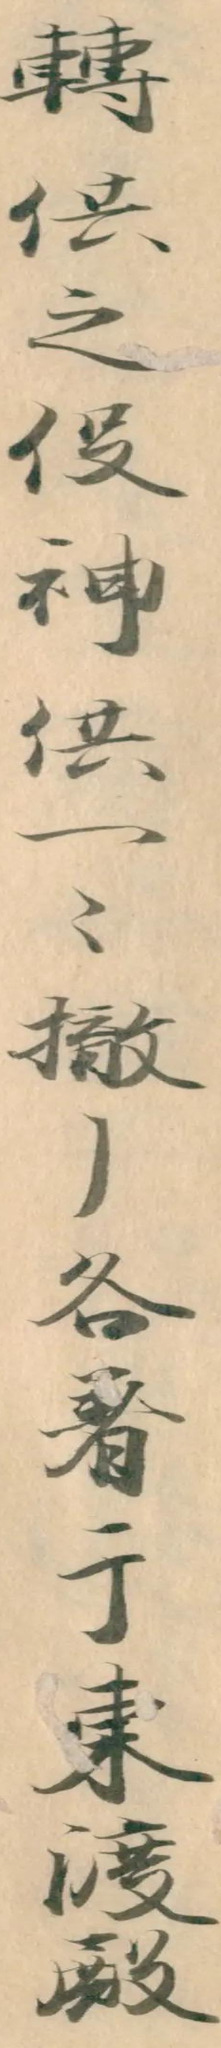転供之役神供一々撒し各着干東渡殿
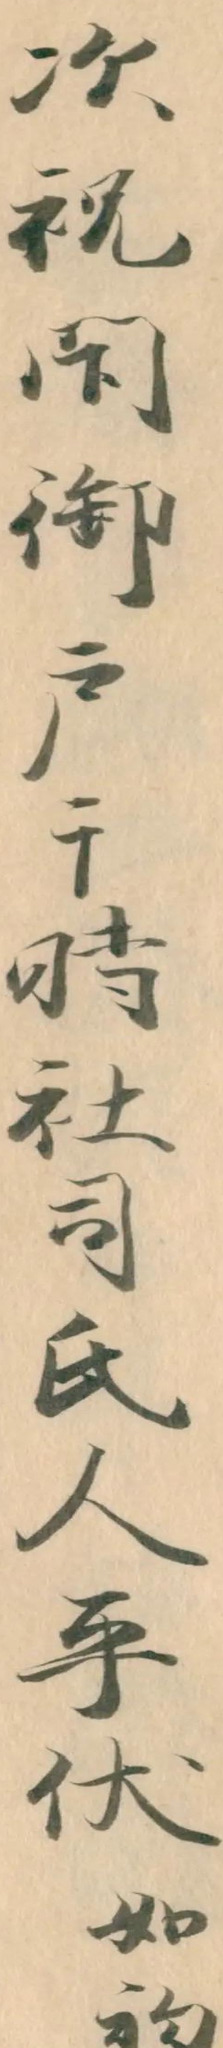次祝閇御戸于時社司氏人平伏如初
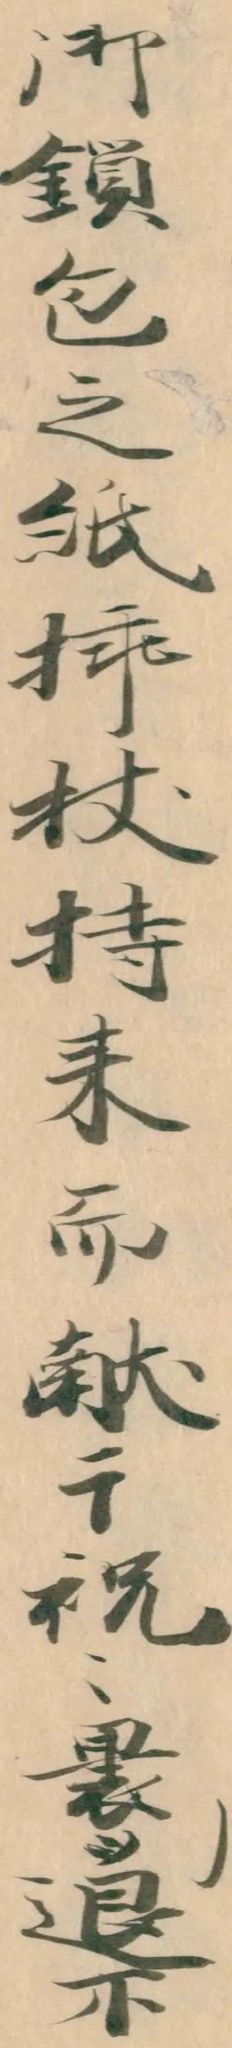御鎖包之紙挿杖持来而献干祝々畏ノ退不
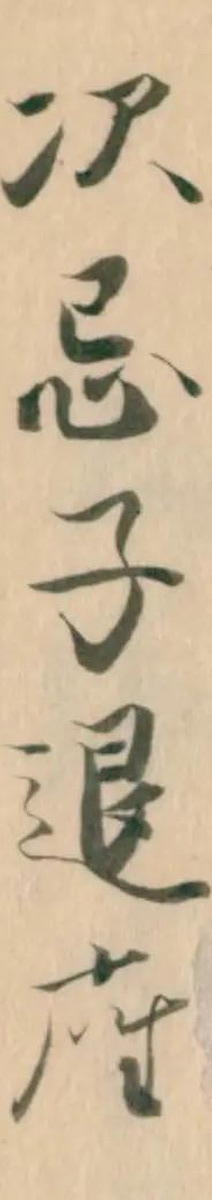次忌子退座
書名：賀茂太神宮年中神事略次第
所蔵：国立国会図書館 National Diet Library, JAPAN
